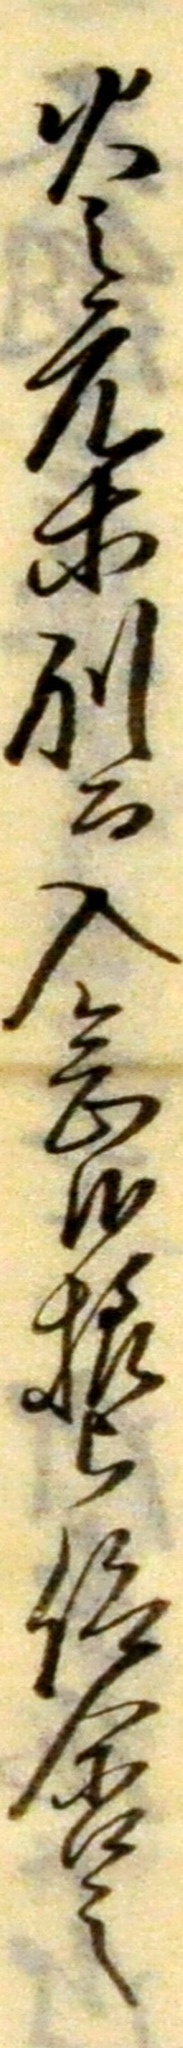火之元等列而入念候様被仰含之

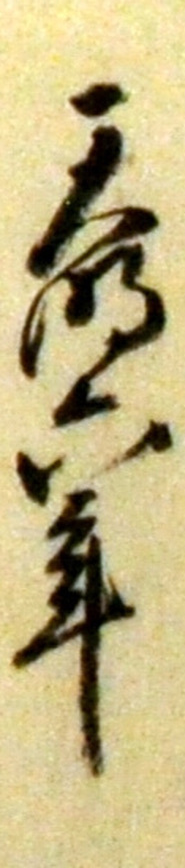天明六年

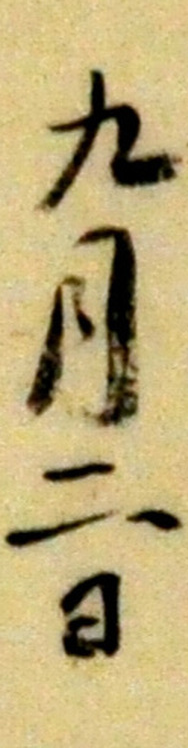九月二日
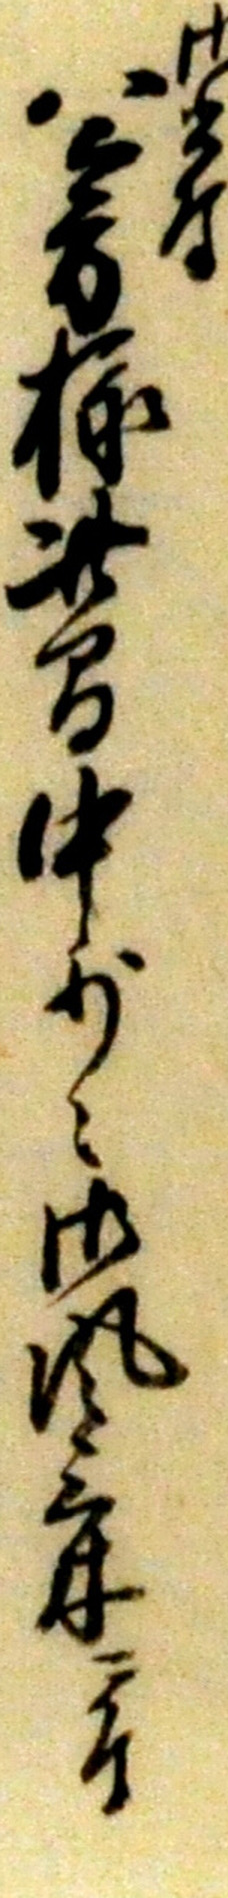公方様此間中少々御風気ニ付
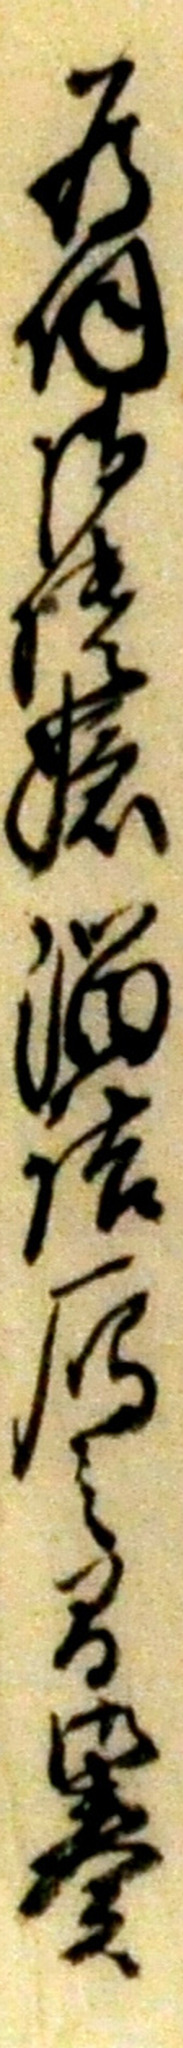為伺御機嫌溜詰鳫之間御奏
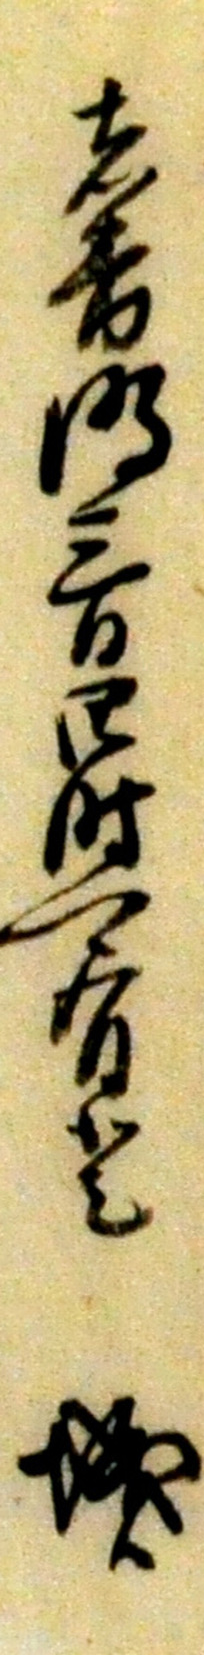者番明三日四時可有登城候
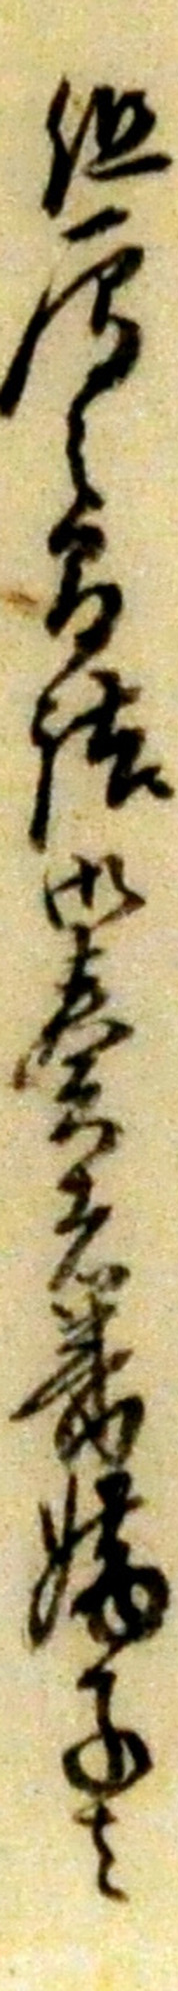但鳫之間詰御奏者番嫡子者
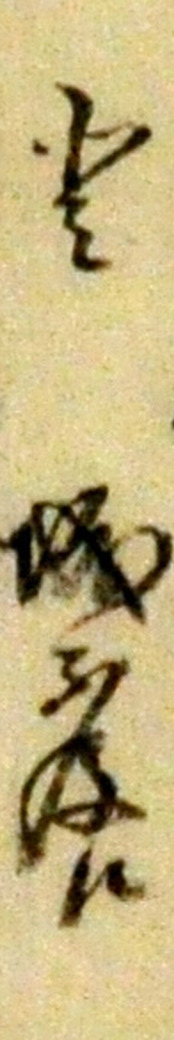登城不及候
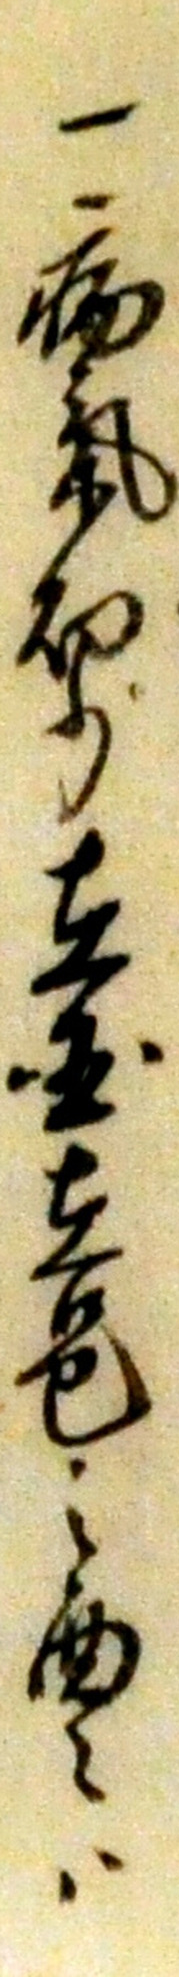一病気幼少在国在邑之面々ハ
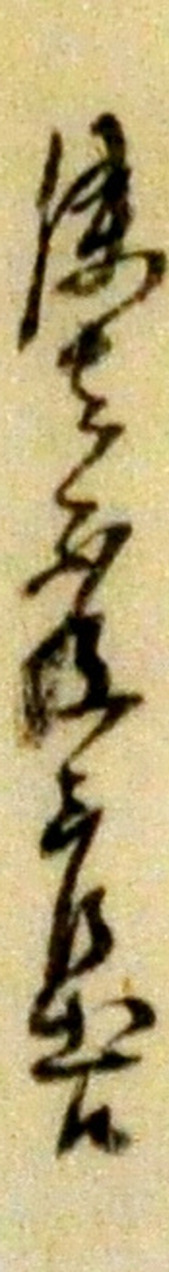使者不及差出候
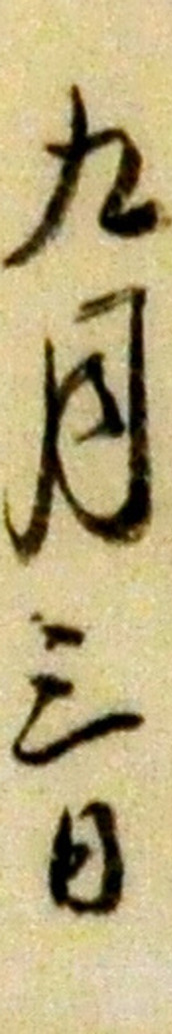九月三日
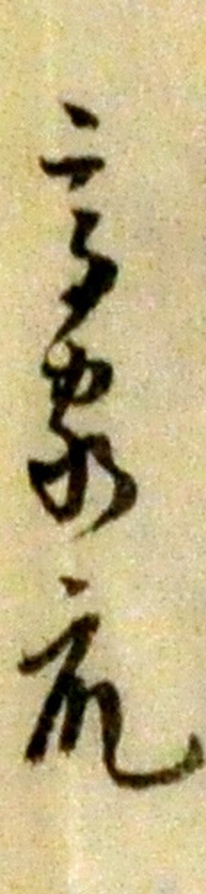高家衆
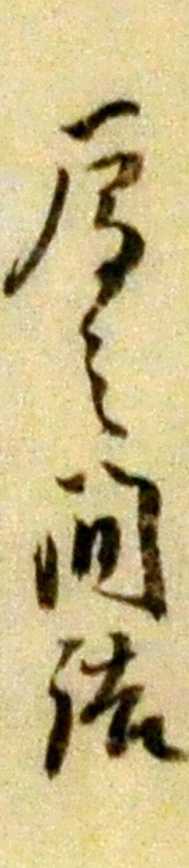鳫之間詰
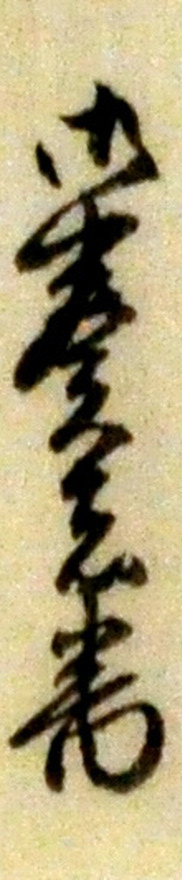御奏者番
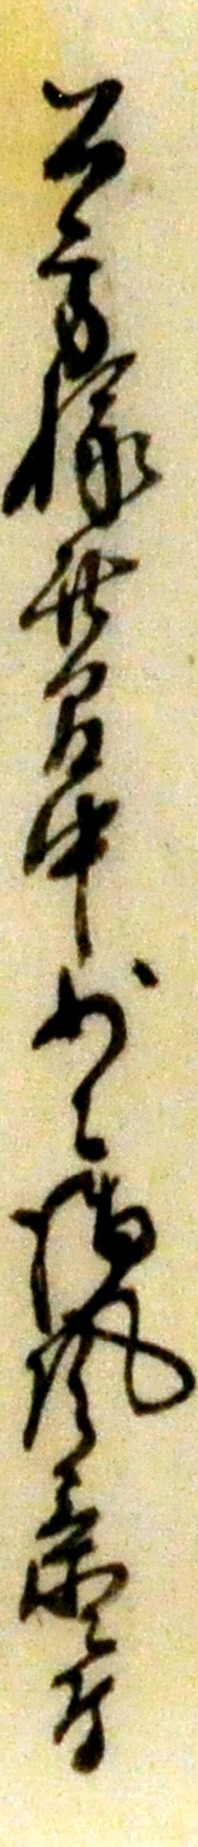公方様此間中少々御風気ニ付
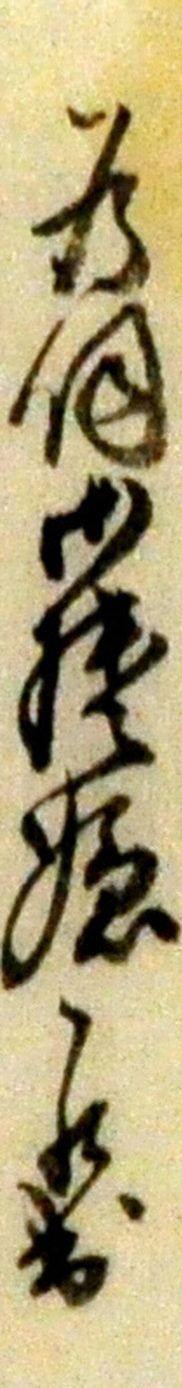為伺御機嫌罷出
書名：書抜
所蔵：伊那市立高遠町図書館・合同会社AMANE
